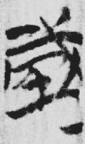城（成）
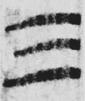三
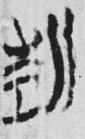折（制）
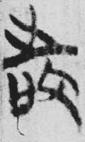○（持）
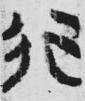行
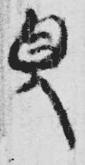視
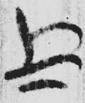上
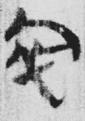衣
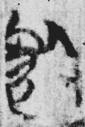飤（食）
